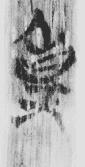事
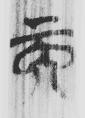而
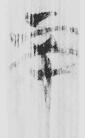不
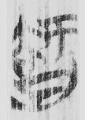智
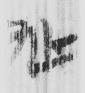喪
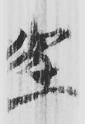𫊟
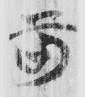可
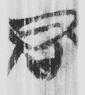君
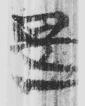是
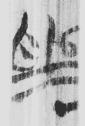爲
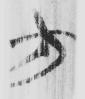方
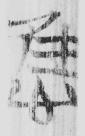惟
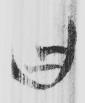曰
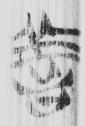善
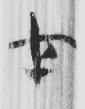才
